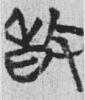○（曹）
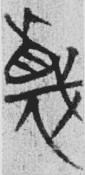蔑（沫）
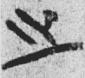之
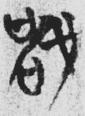○（陳）
